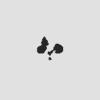十
